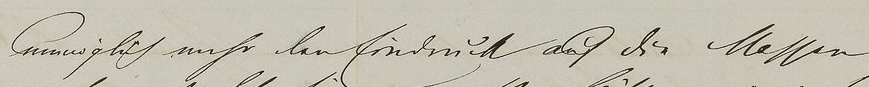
unmöglich mehr den Eindruck auf die Massen
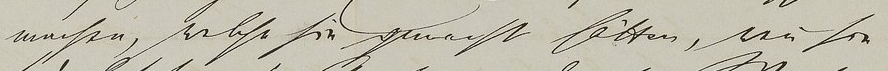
machen, welche sie gemacht hätten, wenn sie
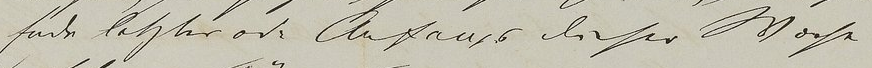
Ende letzter od: Anfangs dieser Woche
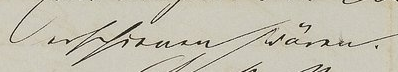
erschienen wären.
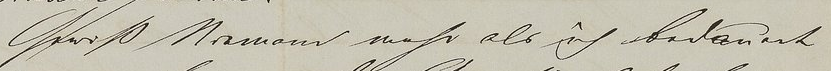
Gewiß Niemand mehr als ich bedauert
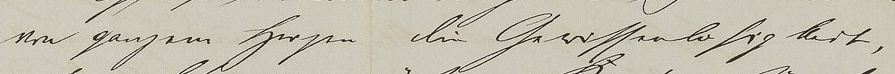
von ganzem Herzen die Gewissenlosigkeit,
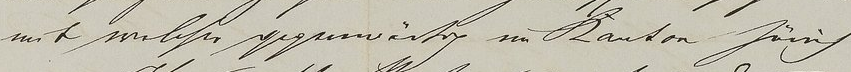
mit welcher gegenwärtig im Kanton Zürich
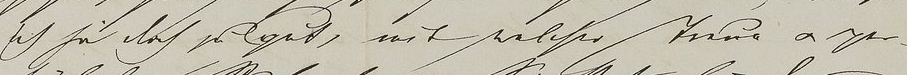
ich ja doch zu gut, mit welcher Treue & per-
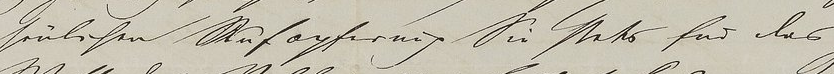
sönlichen Aufopferung Sie stets für das
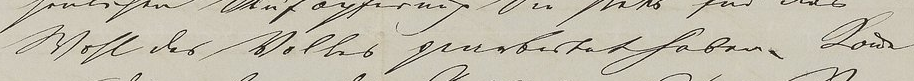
Wohl des Volkes gearbeitet haben. Komme
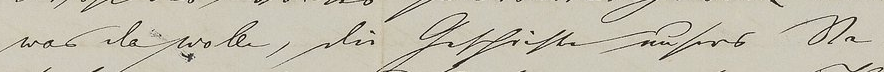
was da wolle, die Geschichte unsers Va-
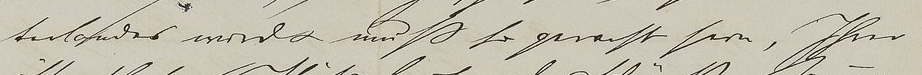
terlandes wird & muß so gerecht sein, Ihrer
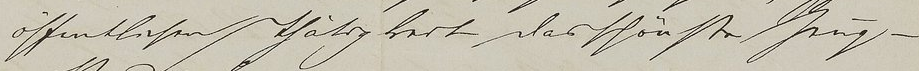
öffentlichen Thätigkeit das schönste Zeug-
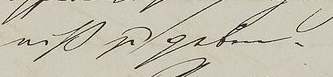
niß zu geben.
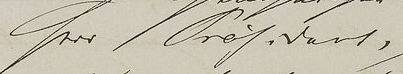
Herr Präsident,
